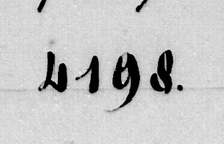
4198.
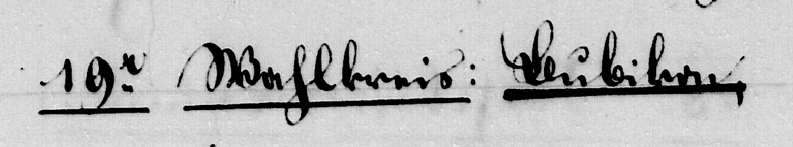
19.r. Wahlkreis: Bubikon
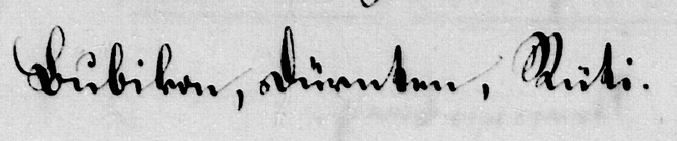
Bubikon, Dürnten, Rüti.
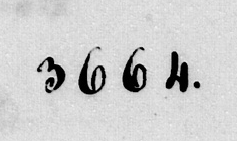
3664.
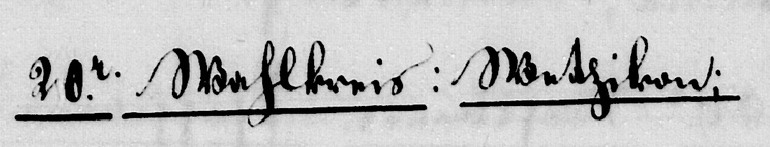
20.r. Wahlkreis: Wetzikon;
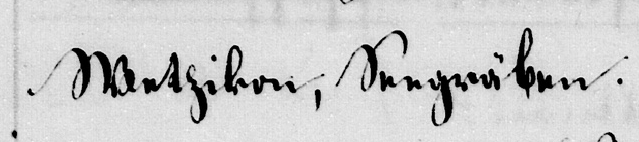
Wetzikon, Seegräben.
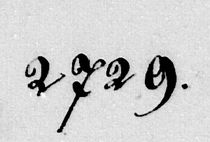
2729.
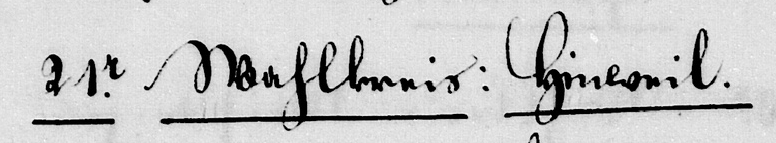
21.r. Wahlkreis: Hinweil.
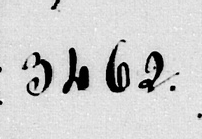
3462.
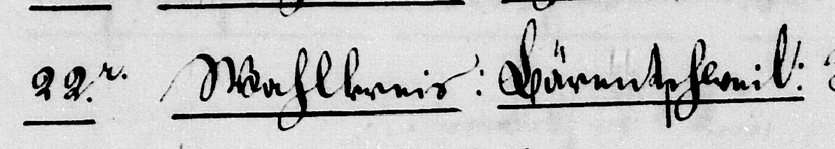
22.r. Wahlkreis: Bärentschweil:
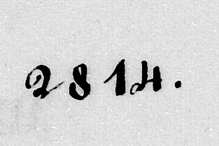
2814.
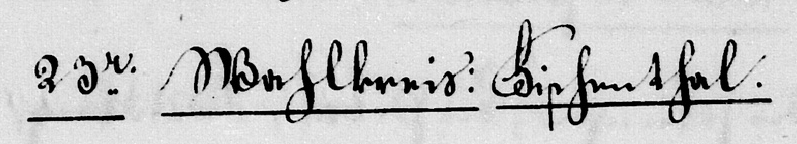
23.r. Wahlkreis: Fischenthal
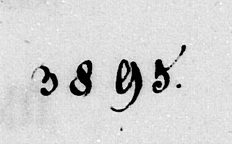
3895.
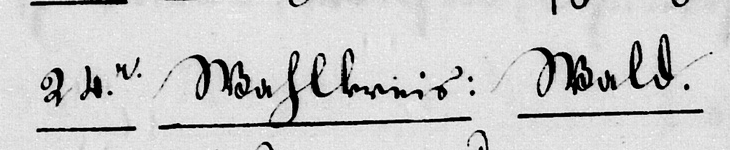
24.r. Wahlkreis: Wald.
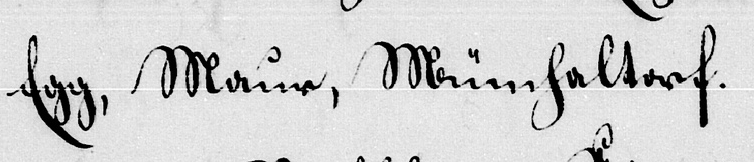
Egg, Maur, Münchaltorf.
